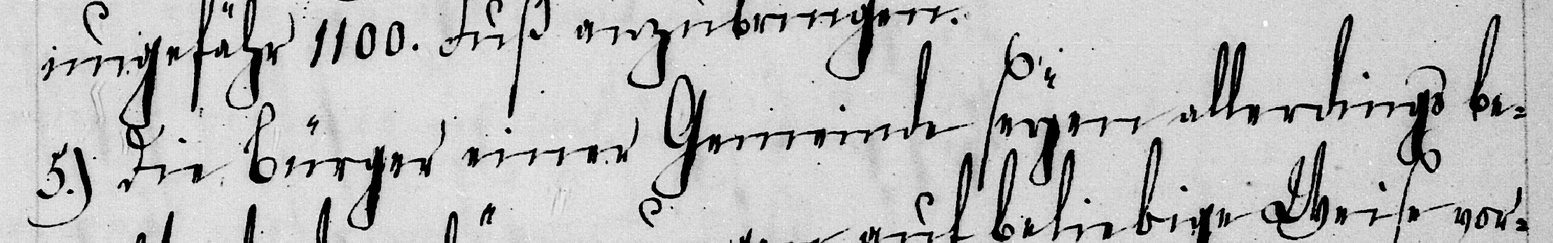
5.) Die Bürger einer Gemeinde seyen allerdings be¬
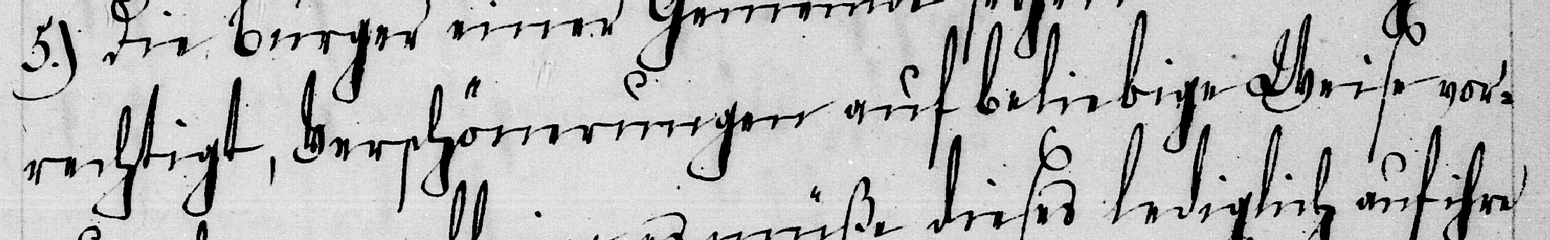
rechtigt, Verschönerungen auf beliebige Weise vor¬
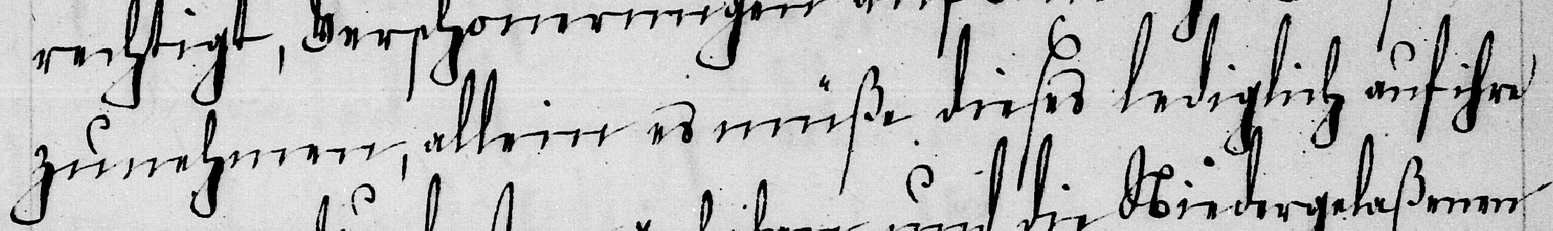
zunehmen, allein es müße dieses lediglich auf ihre
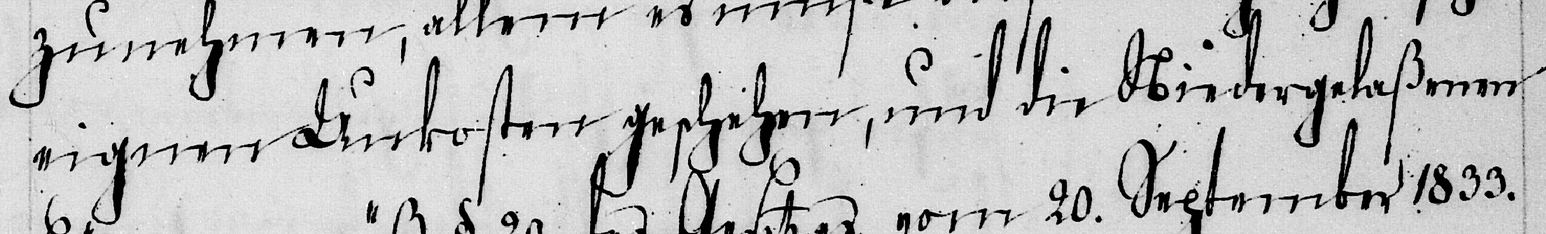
eigenen Unkosten geschehen, und die Niedergelaßenen
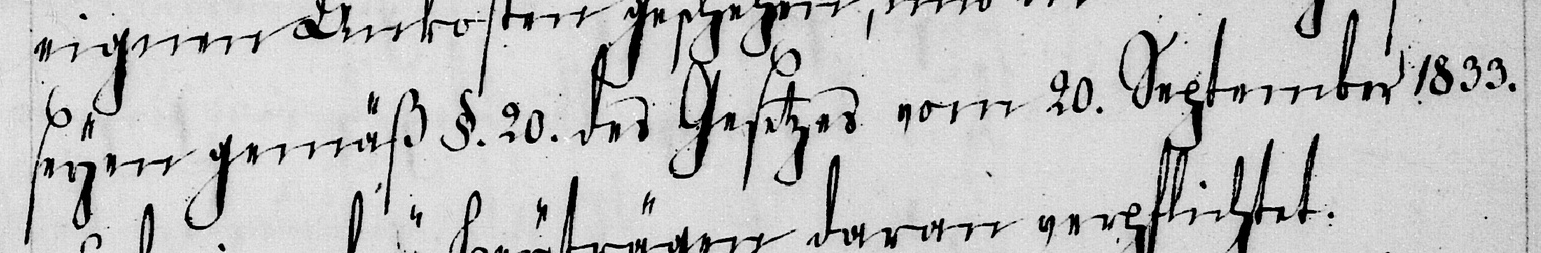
seyen gemäß §. 20. des Gesetzes vom 20. September 1833.
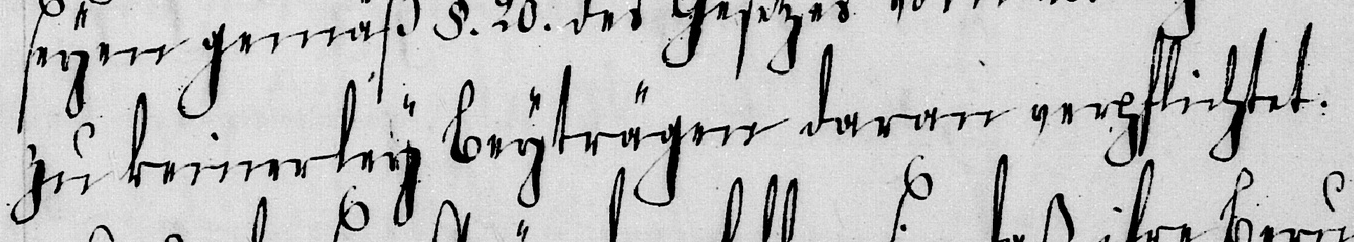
zu keinerley Beyträgen daran verpflichtet.
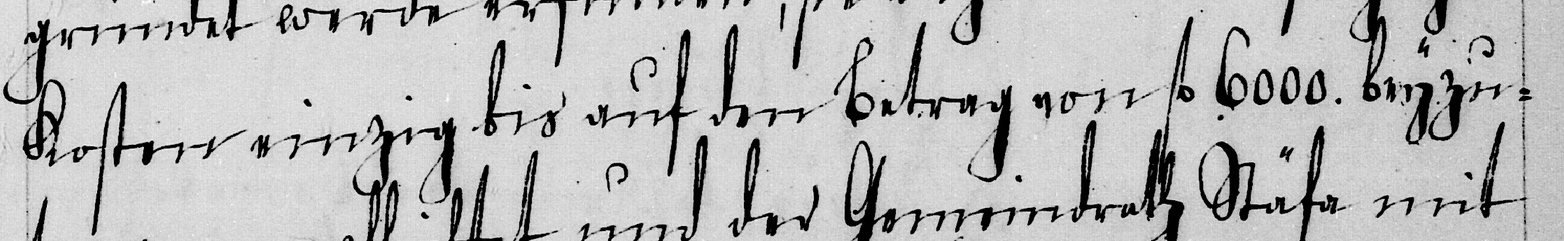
Kosten einzig bis auf den Betrag von fl. 6000 beyzu¬
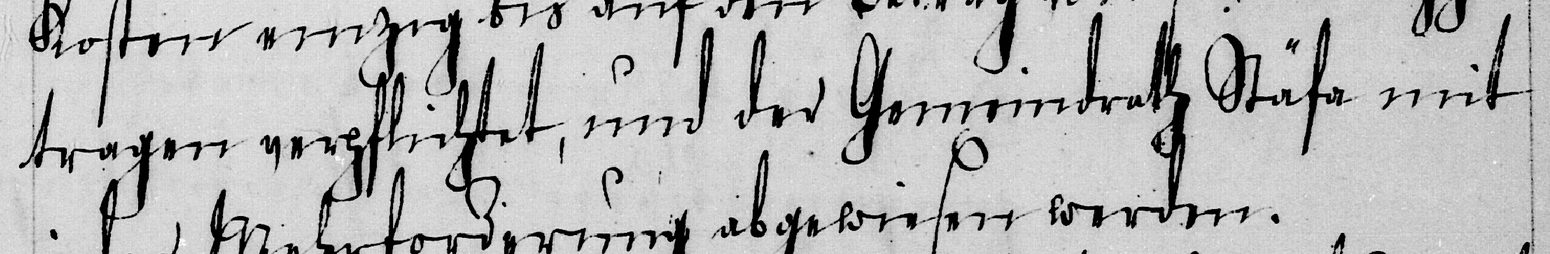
tragen verpflichtet, und der Gemeindrath Stäfa mit
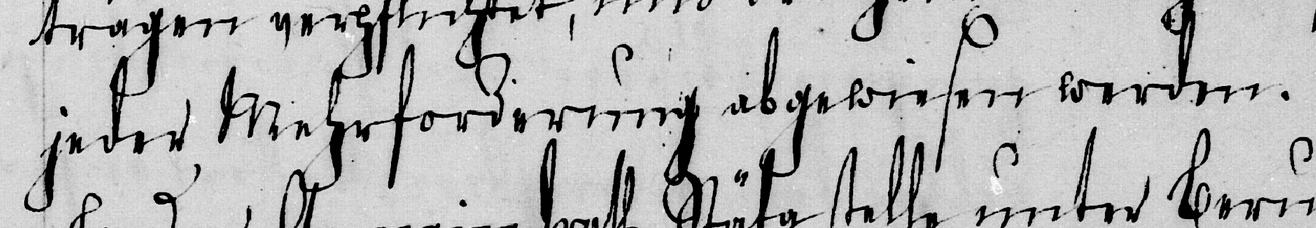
jeder Mehrforderung abgewiesen werden.
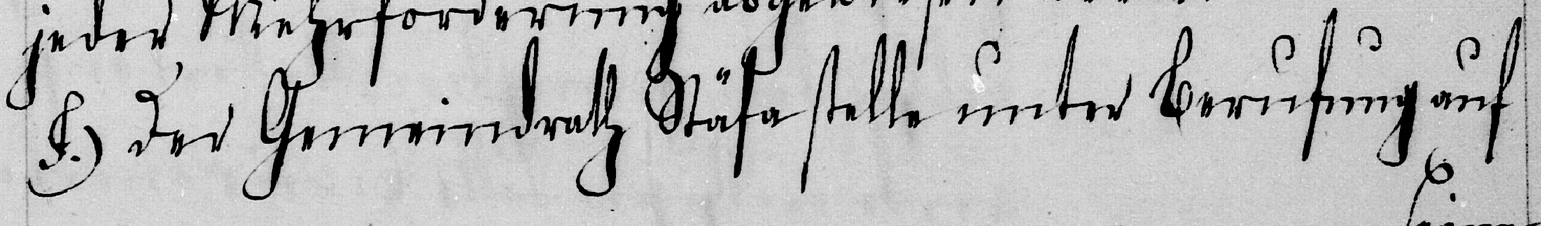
F.) Der Gemeindrath Stäfa solle unter Berufung auf
